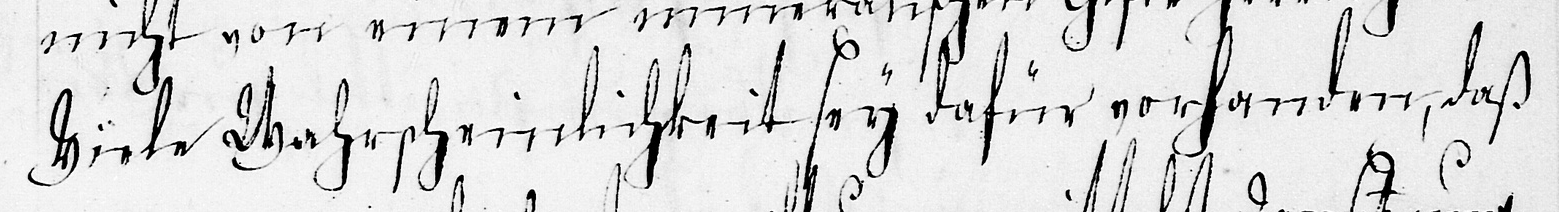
Viele Wahrscheinlichkeit sey dafür vorhanden, daß
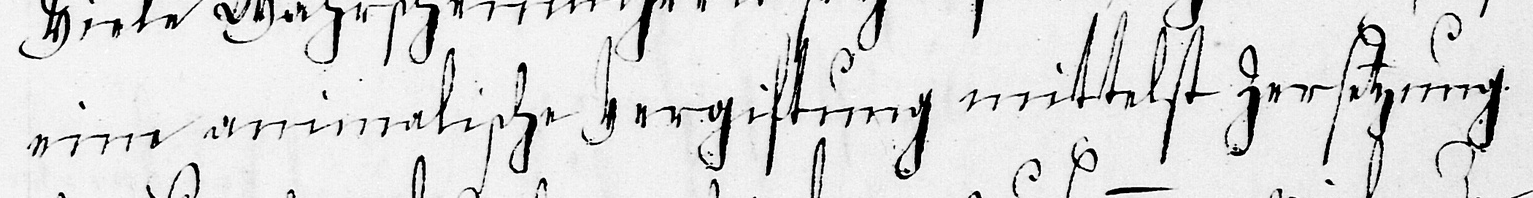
eine animalische Vergiftung mittelst Zersetzung
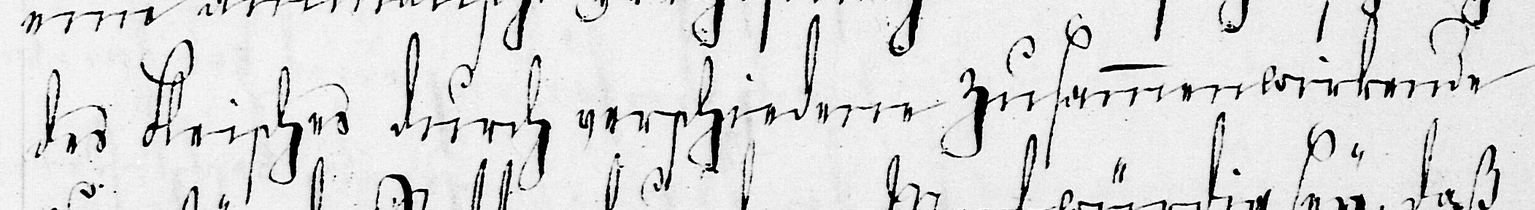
des Fleisches durch verschiedene zusammenwirkende
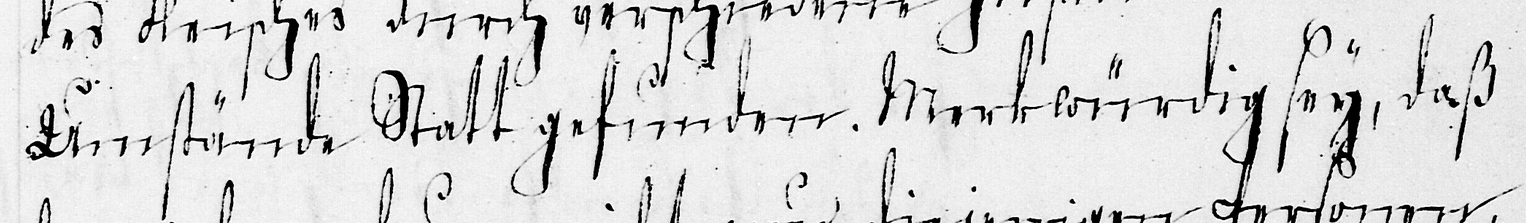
Umstände Statt gefunden. Merkwürdig sey, daß
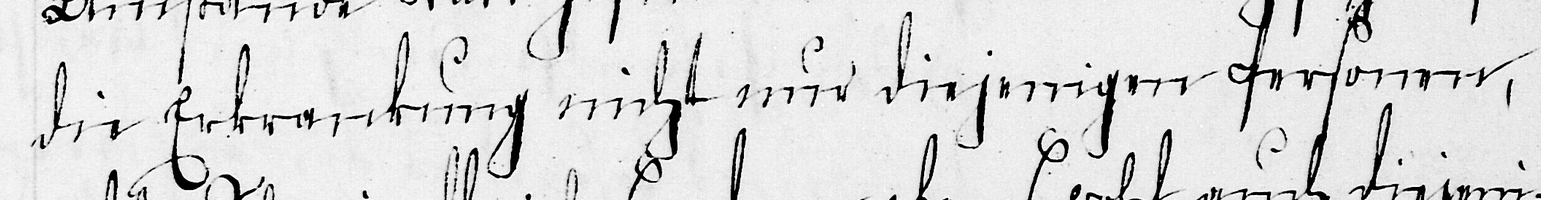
die Erkrankung nicht nur diejenigen Personen,
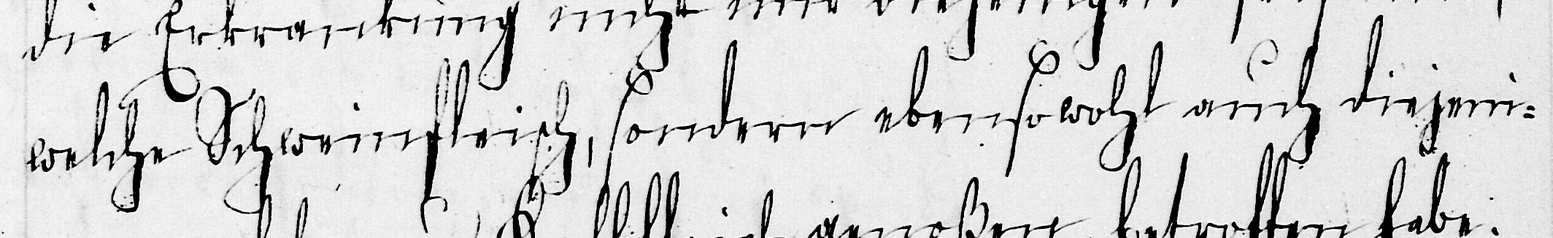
welche Schweinfleisch, sondern ebensowohl auch diejeni¬
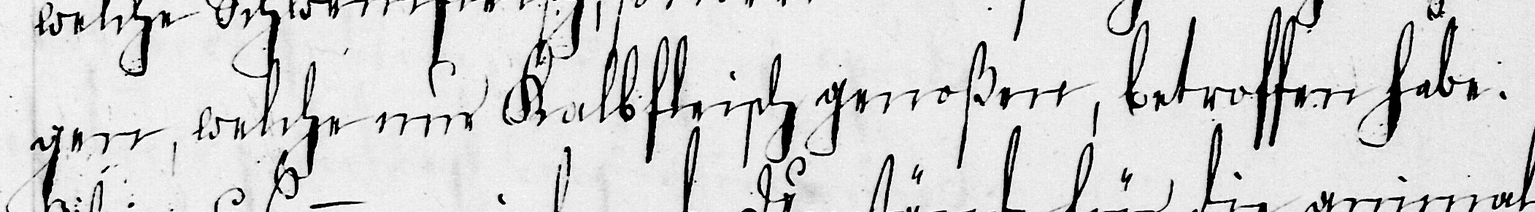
gen, welche nur Kalbfleisch genoßen, betroffen habe.
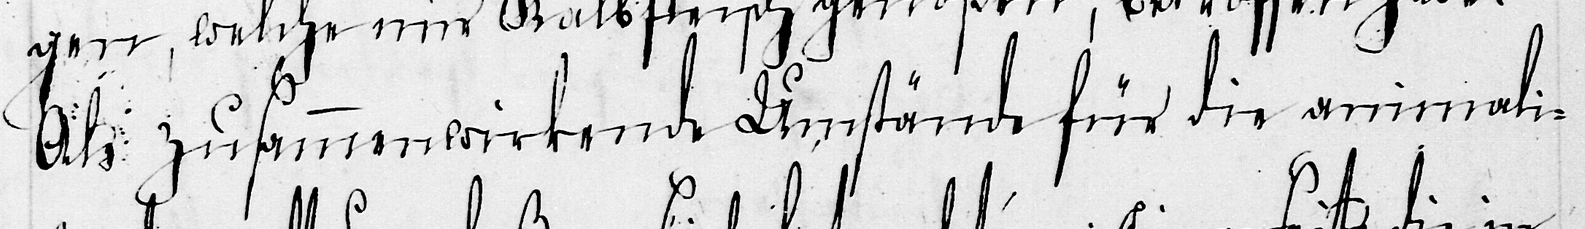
Als zusammenwirkende Umstände für die animali¬
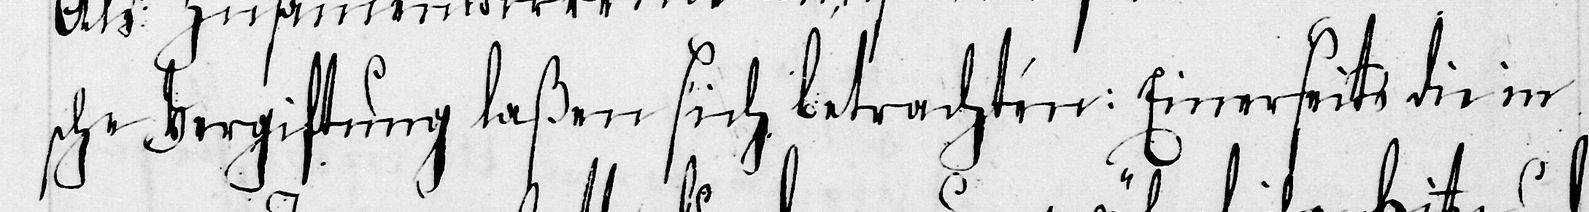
sche Vergiftung laßen sich betrachten: Einerseits die in
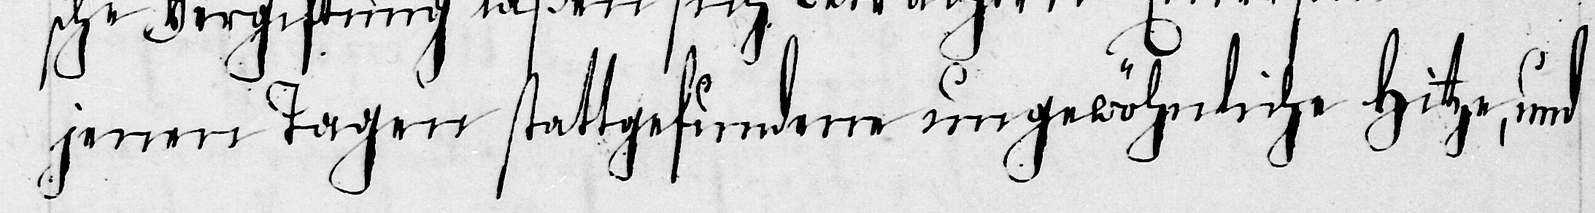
jenen Tagen stattgefundene ungewöhnliche Hitze, und
